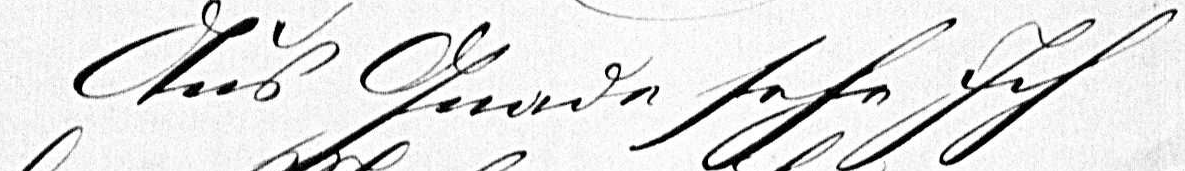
Aus Gnade sehe Jch
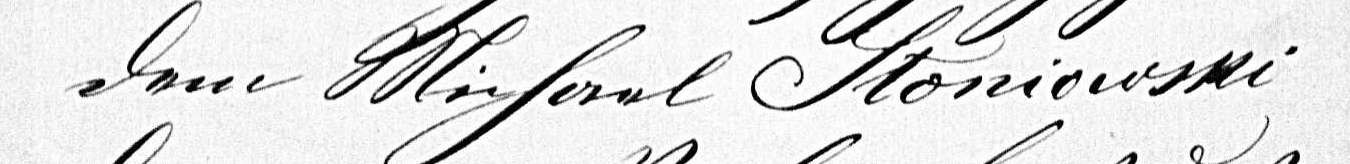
dem Michael Stoniowski
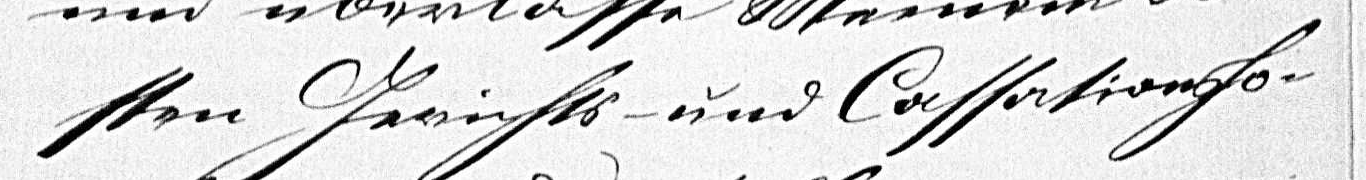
sten Gerichts- und Cassationsho¬
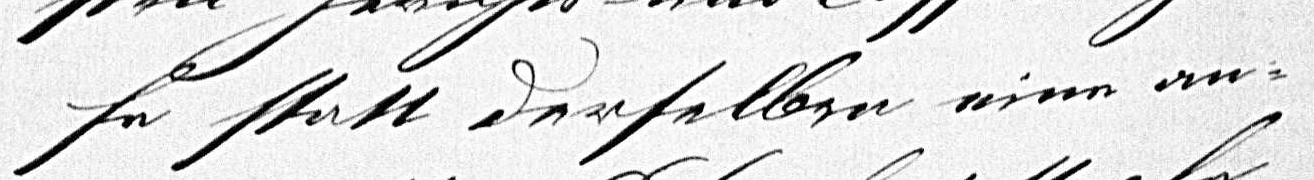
fe statt derselben eine an¬
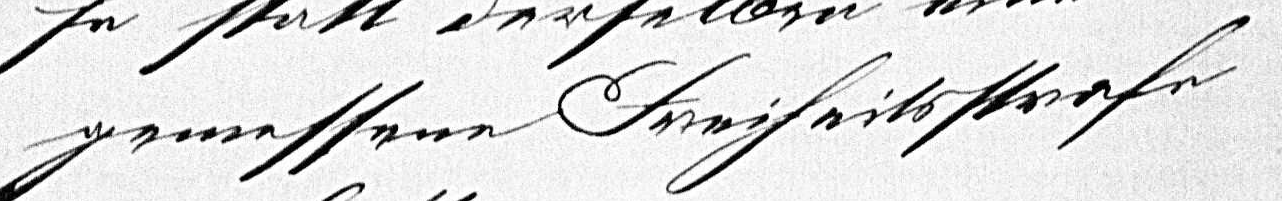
gemessene Freiheitsstrafe
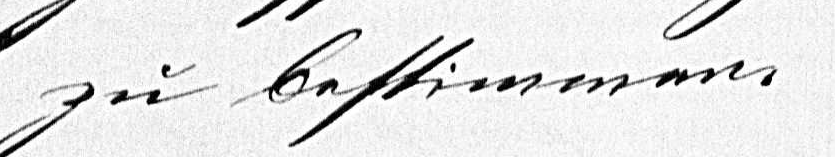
zu bestimmen.
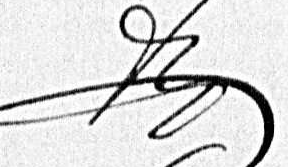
xx
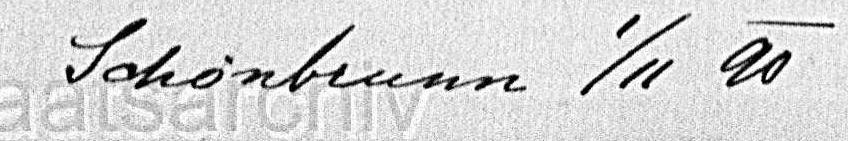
Schönbrunn 1/11 90
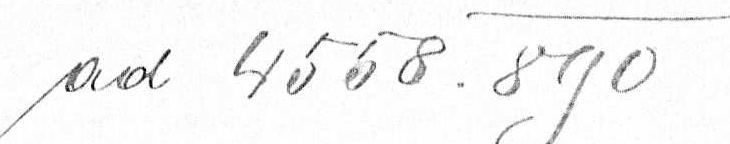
ad 4558. 890
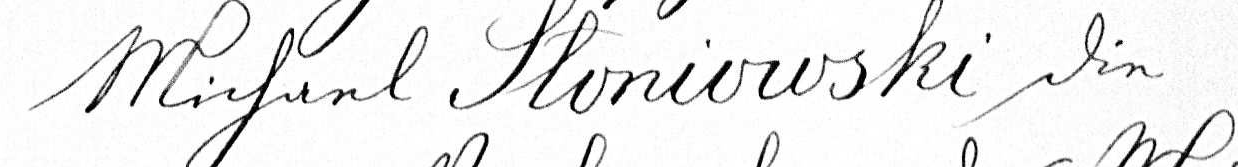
Michael Stoniowski die
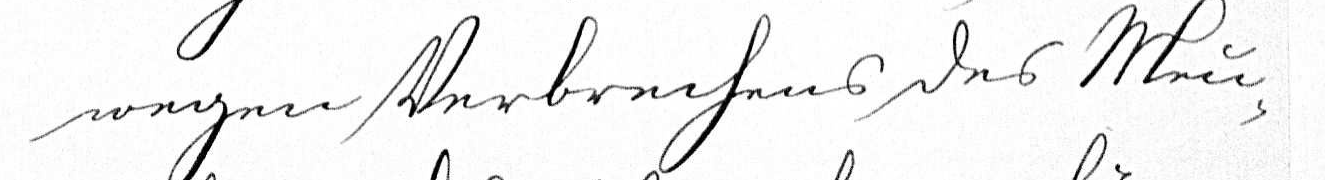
wegen Verbrechens des Meu¬
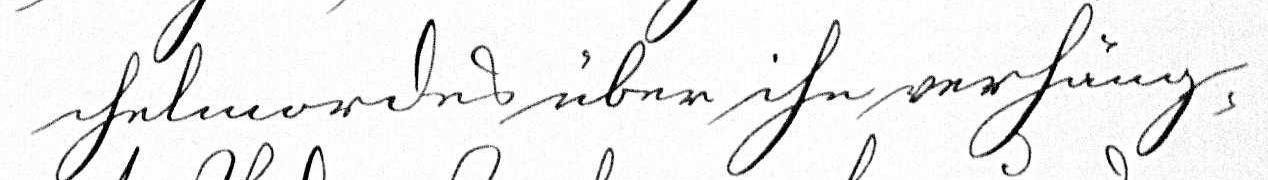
chelmordes über ihn verhäng¬
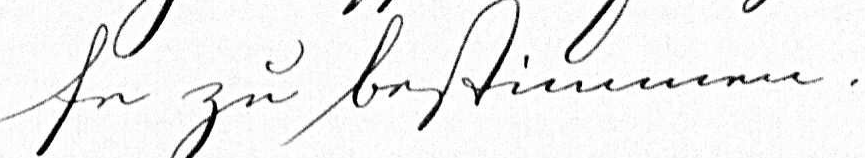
fe zu bestimmen.
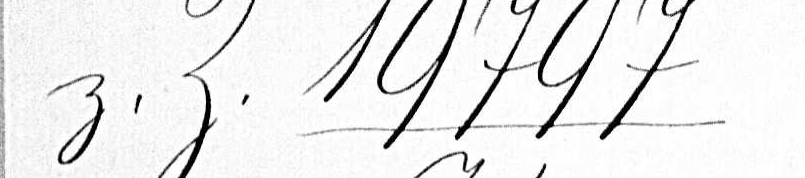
z. Z. 19797
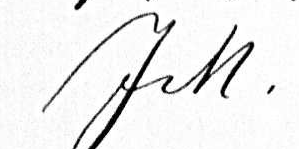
JM.
